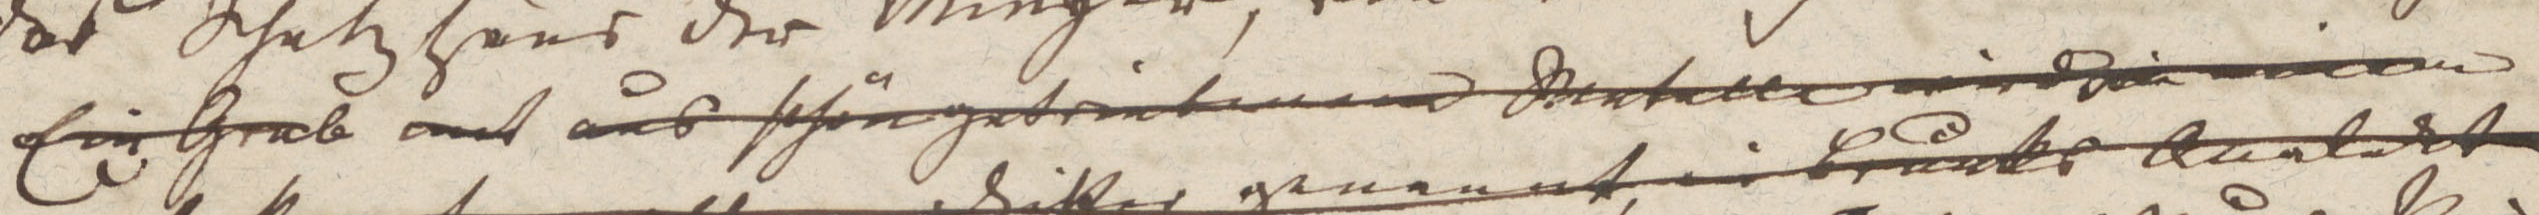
Ein Grab mit aus schön getriebenem Metalle wird einem
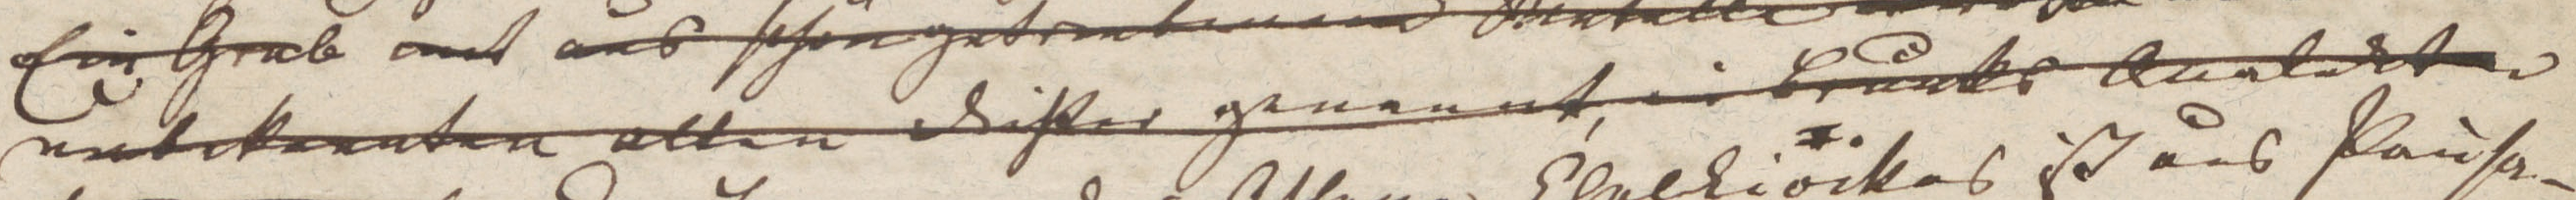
unbekannten alten Dichter genannt, in Brunks Analekten
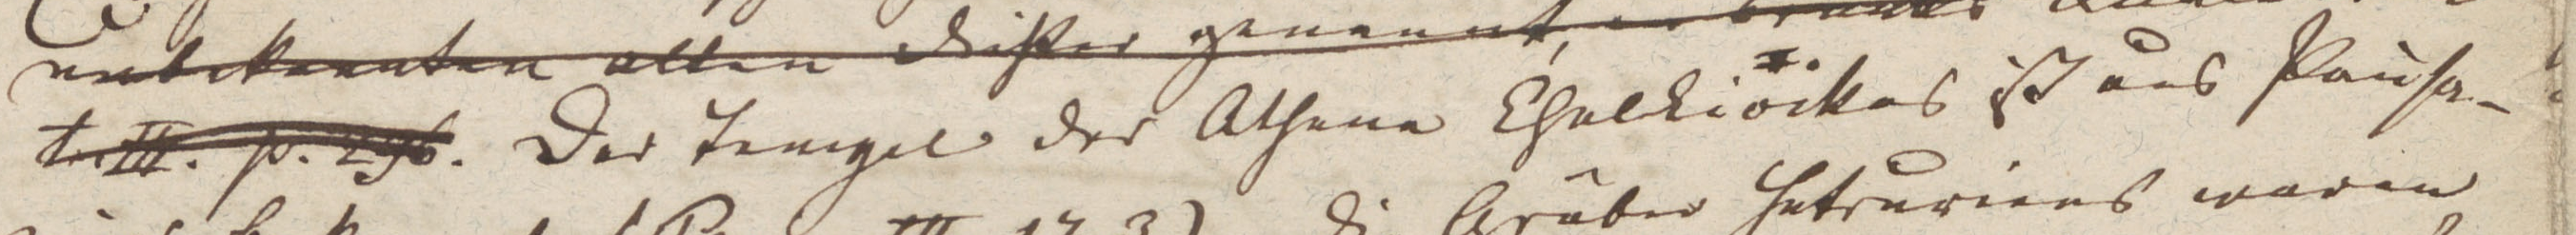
III. p. 296. Der Tempel der Athena Chalkiikos ist aus Pausa-
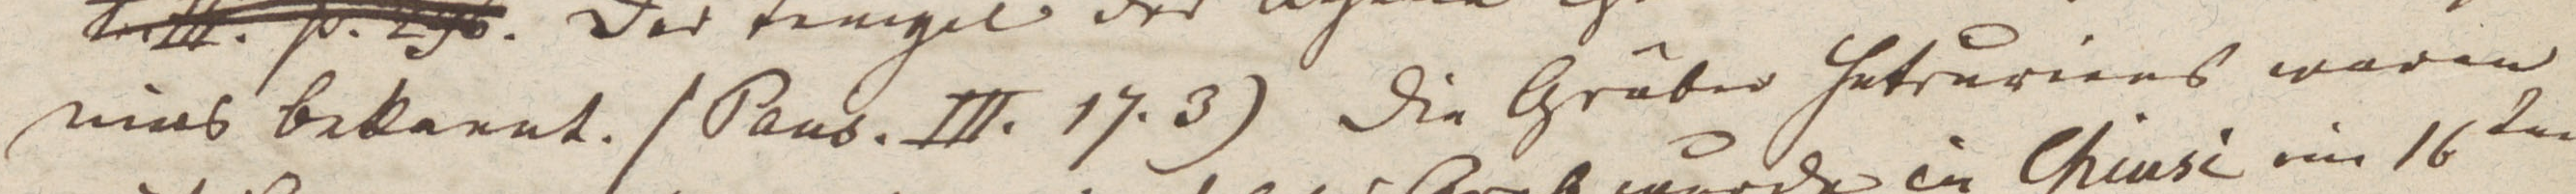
nius bekannt. (Paus. III. 17. 3) Die Gräber Hetruriens waren
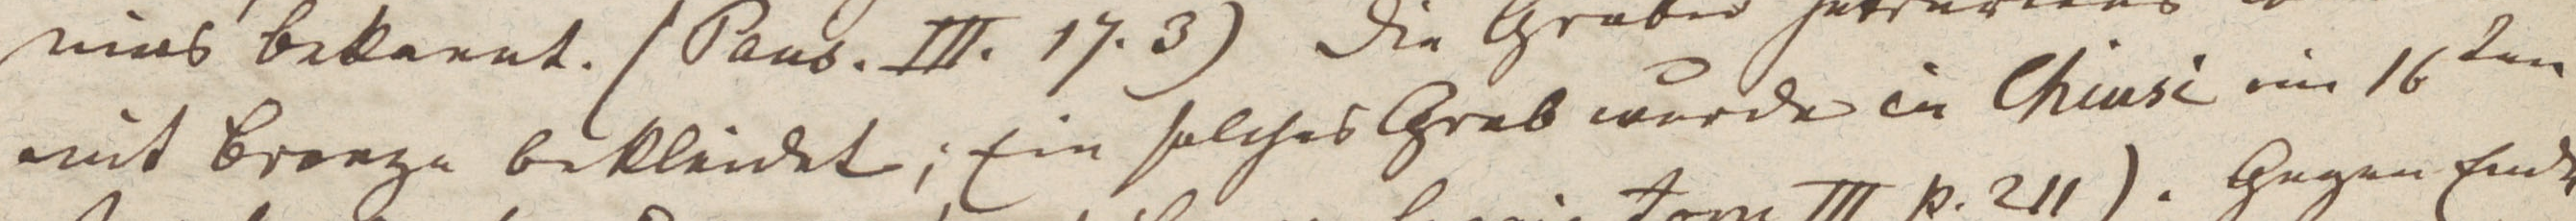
mit Bronze bekleidet; Ein solches Grab wurde in Chiusi im 16ten
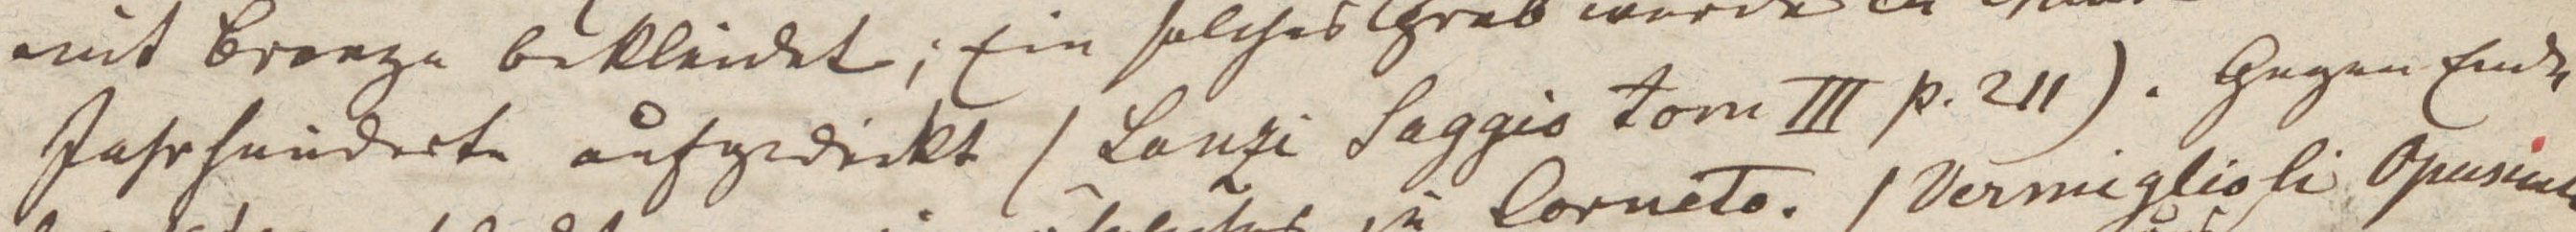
Jahrhundert aufgedeckt (Lanzi Saggio tom III p. 211). Gegen Ende
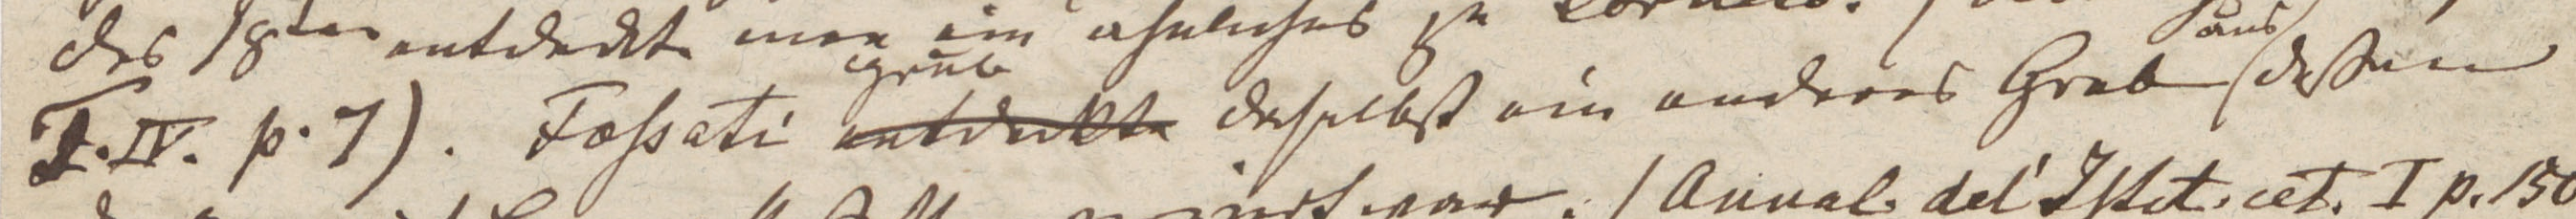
T. IV. p. 7). Fosati entdeckte grub daselbst ein anderes Grab aus dessen
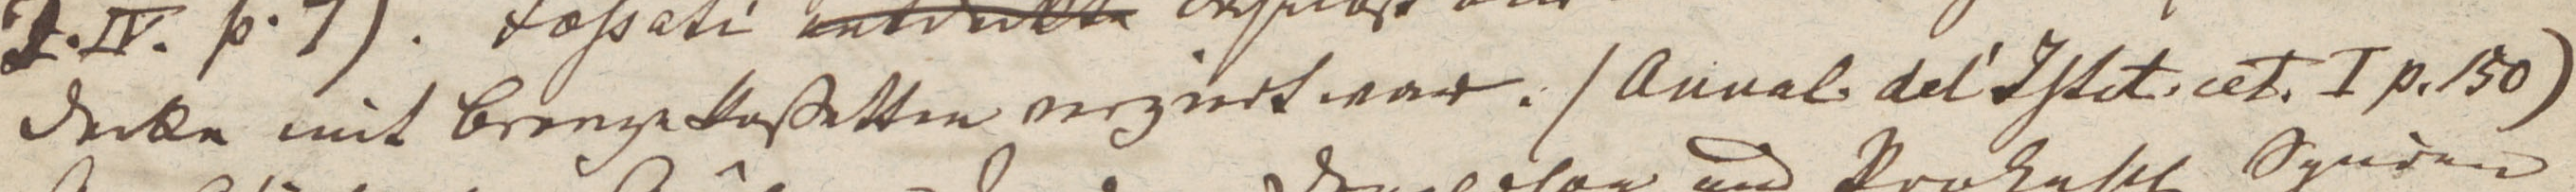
Decke mit Bronzekassetten verziert war. (Annal. del'Istit. cet. I p. 150)
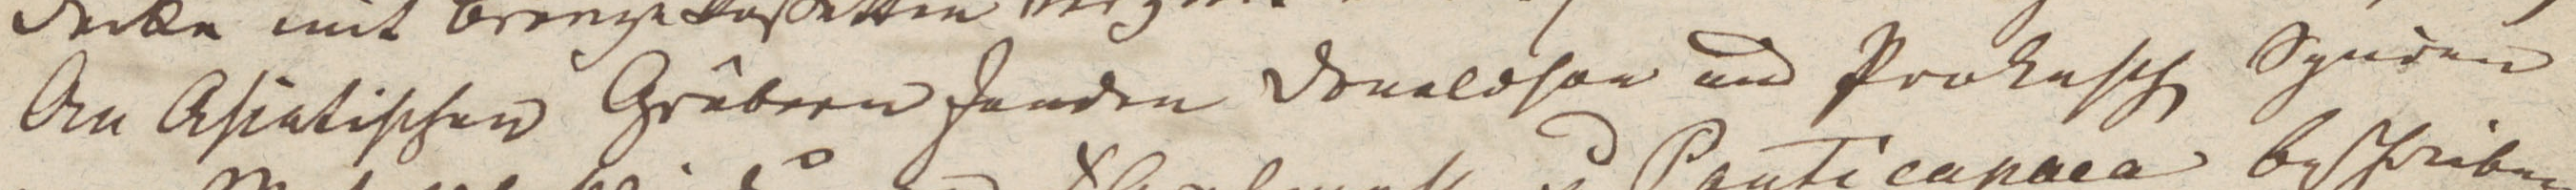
An Asiatischen Gräbern fanden Donaldson und Prokesch Spuren
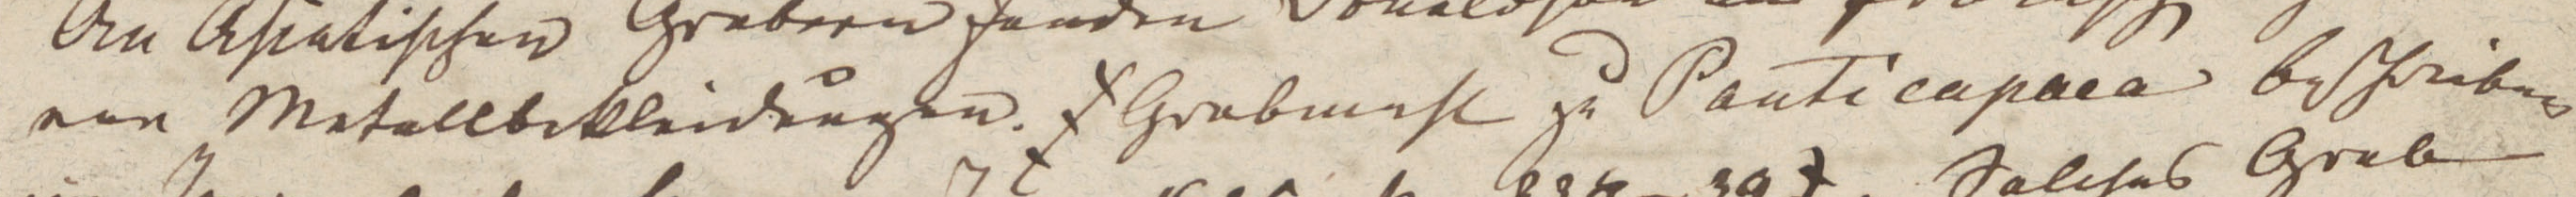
von Metallbekleidungen. (Grabmahl zu Panticapaea beschrieben
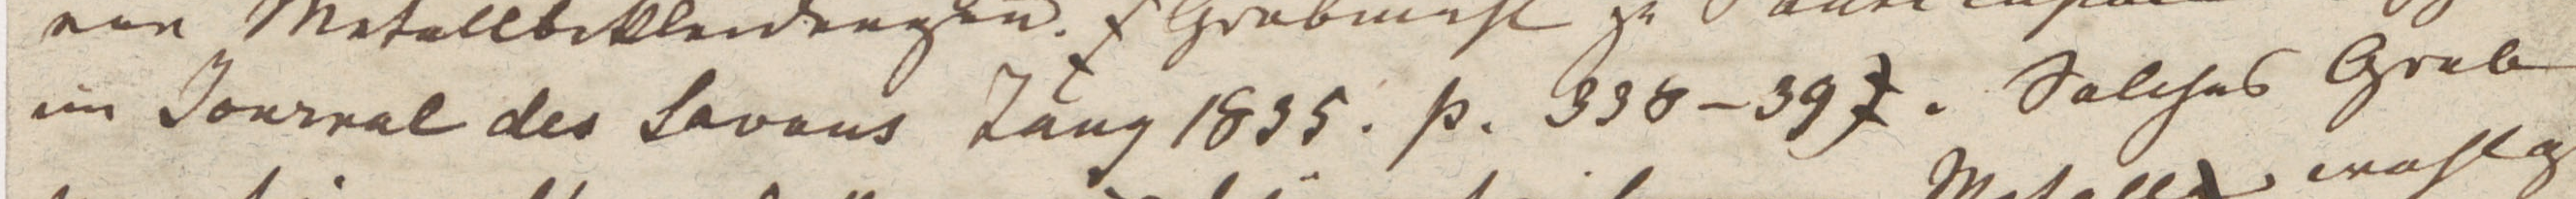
im Journal des Savans 1835. p. 338–39). Solches Grab
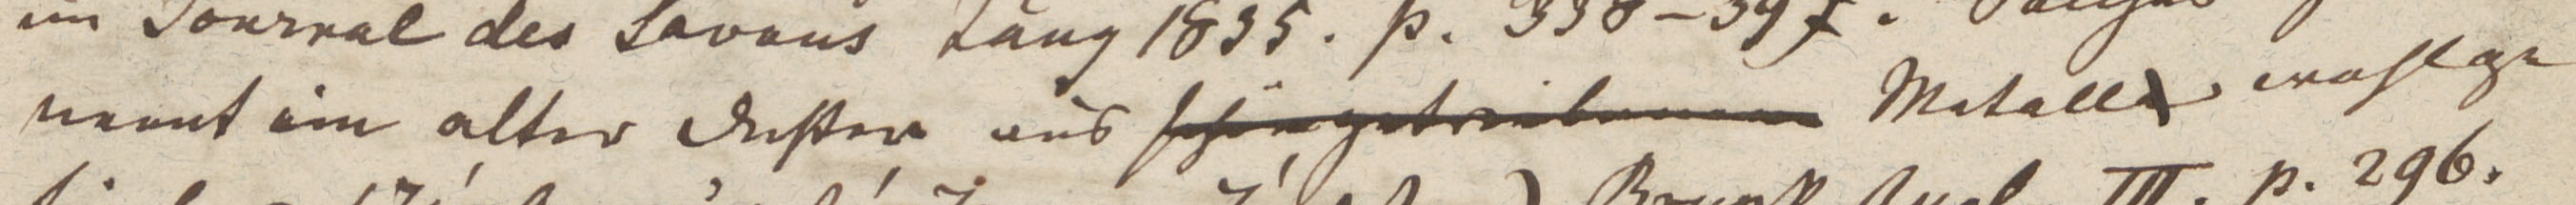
nennt ein alter Dichter aus schön getriebenem Metalle wohlge
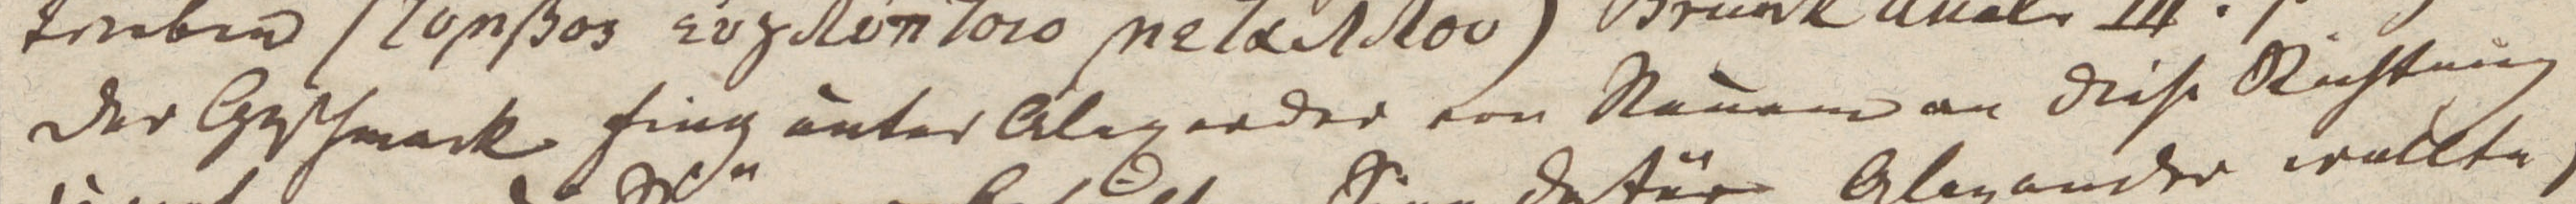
Der Geschmack fing unter Alexander von Neuem an diese Richtung
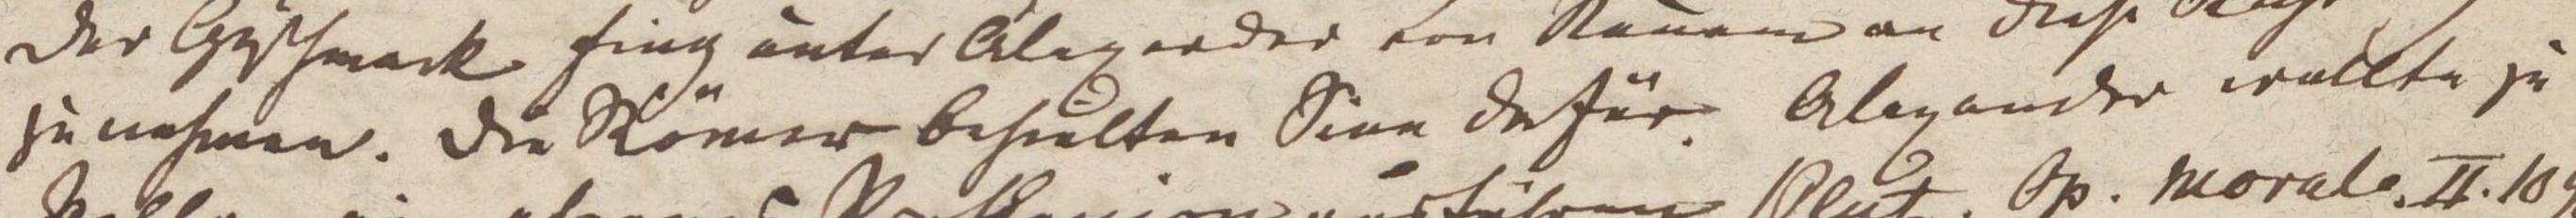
zu nehmen. Die Römer behielten Sinn dafür. Alexander wollte zu
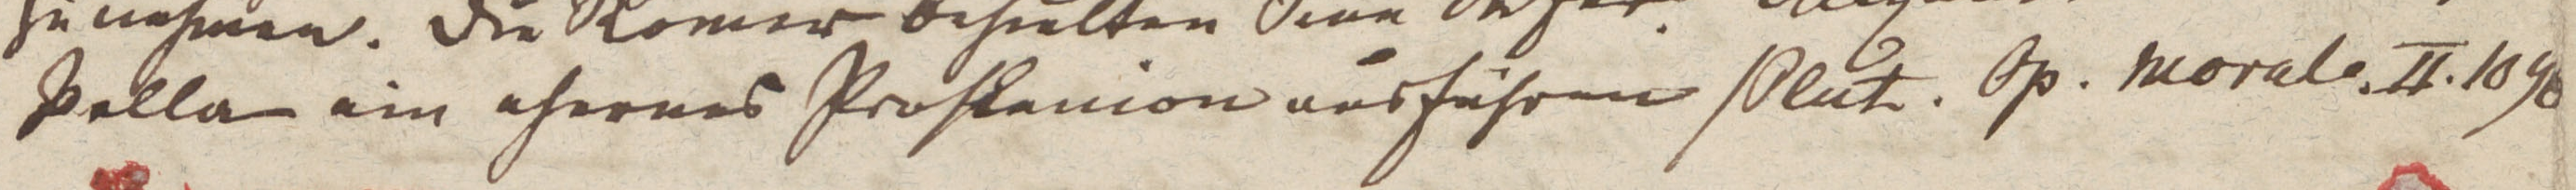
Pella ein ehernes Proskenion ausführen (Plut. Op. moral. II. 1096
